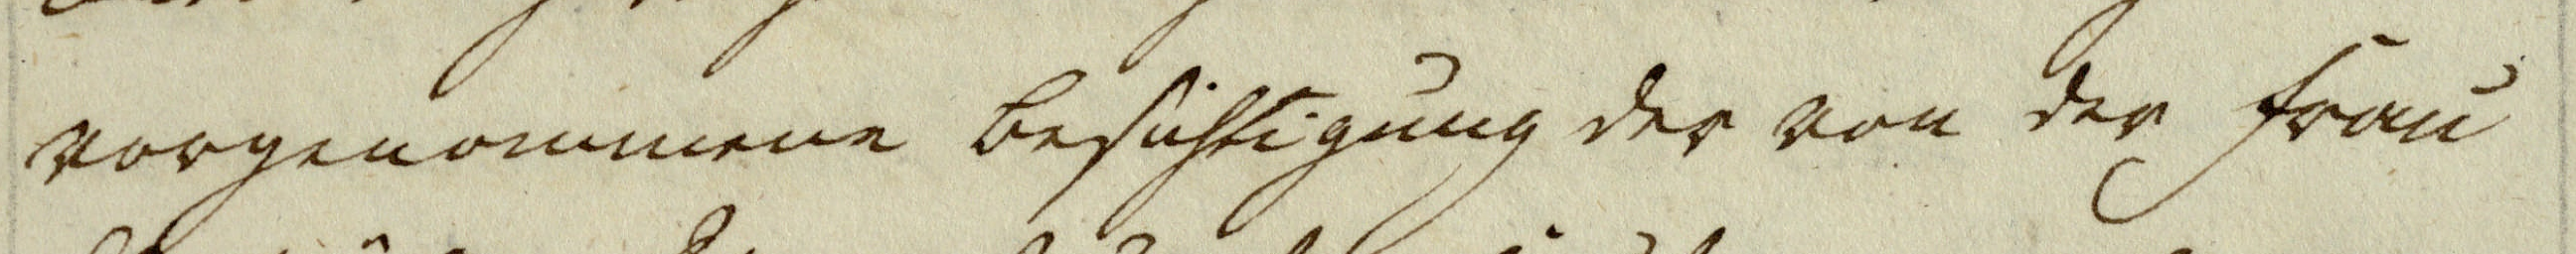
vorgenommene Besichtigung der von der Frau
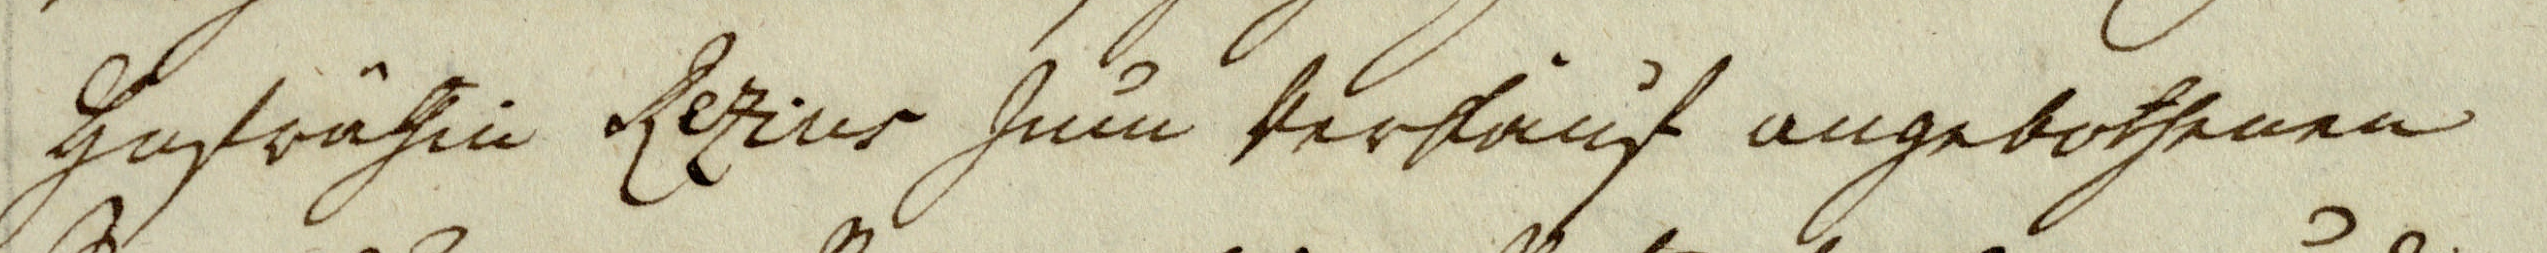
Hofräthin Rezius zum Verkauf angebothenen
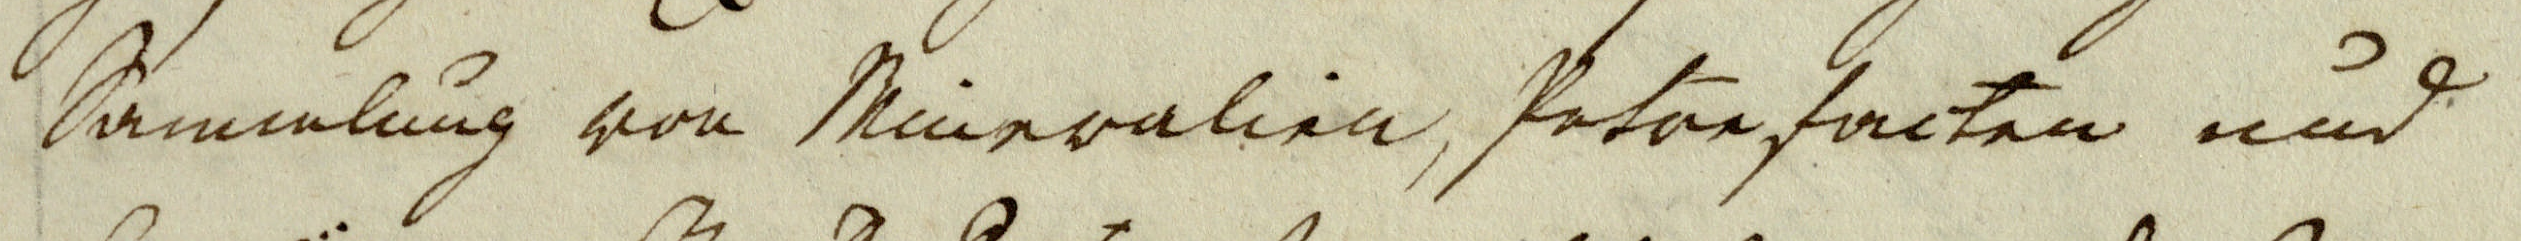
Sammlung von Mineralien, Petrefacten und
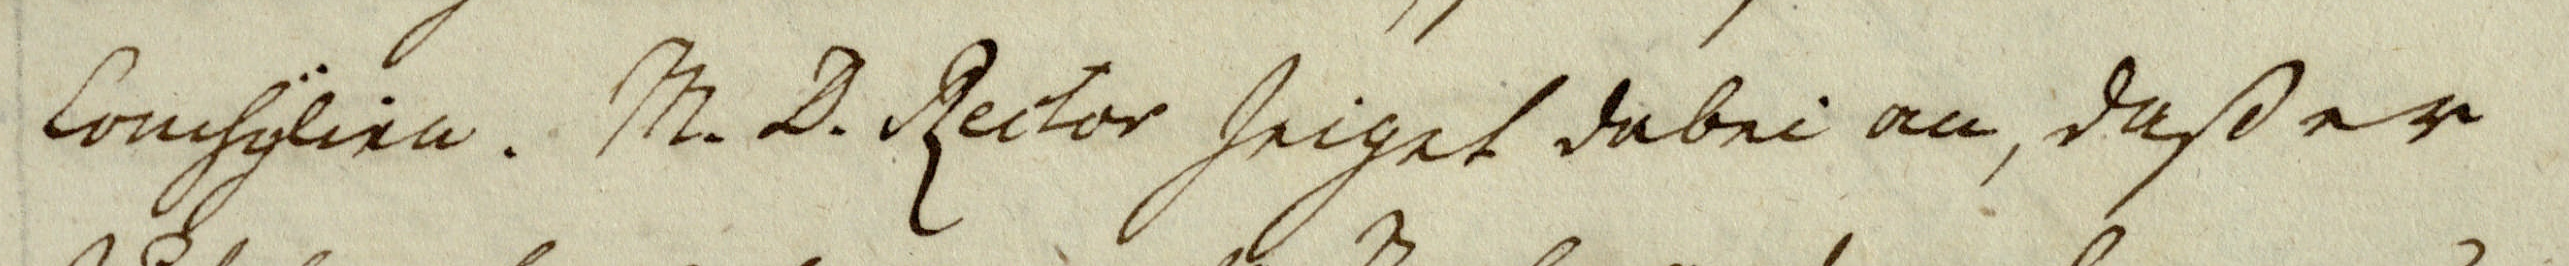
Conchylien. M. D. Rector zeiget dabei an, daß er
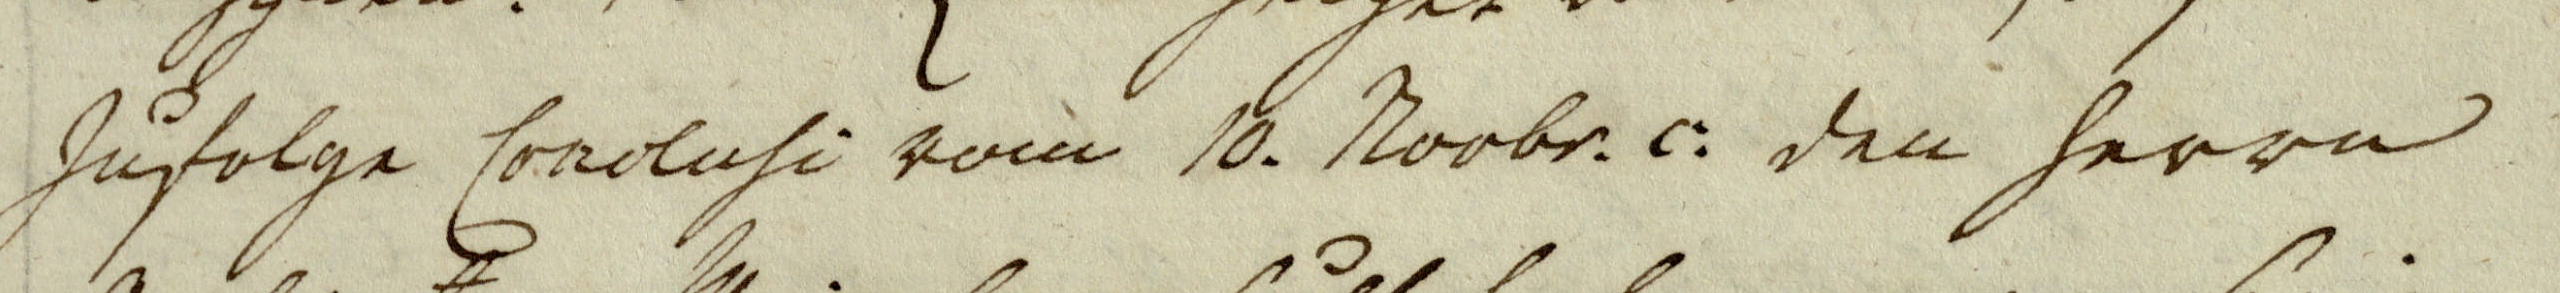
zufolge Conclusi vom 10. Novbr. c. den Herrn
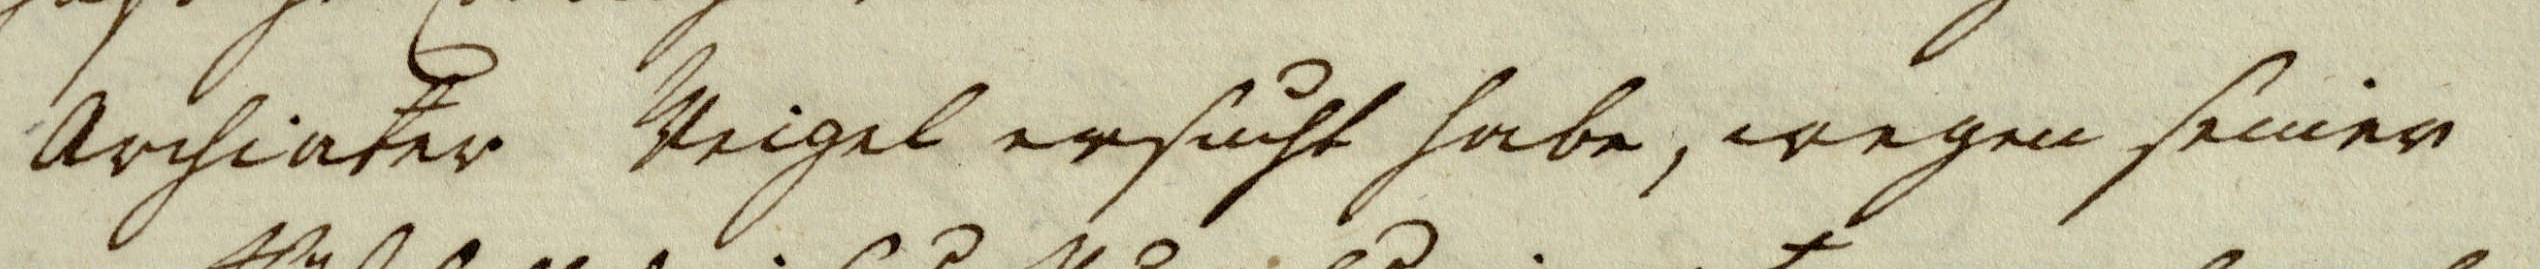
Archiater Weigel ersucht habe, wegen seiner
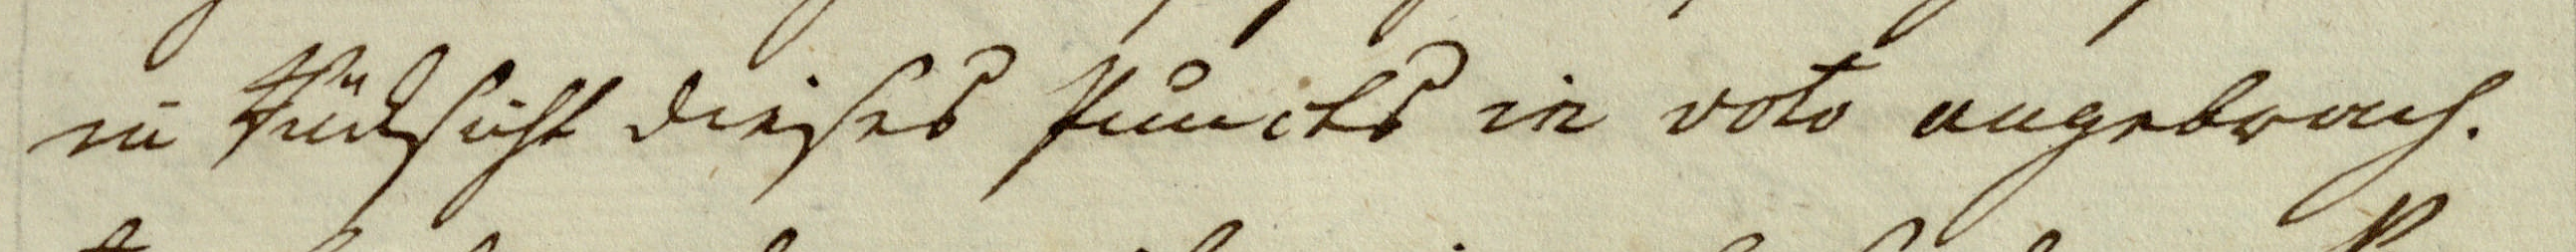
in Rücksicht dieses Puncts in voto angebrach¬
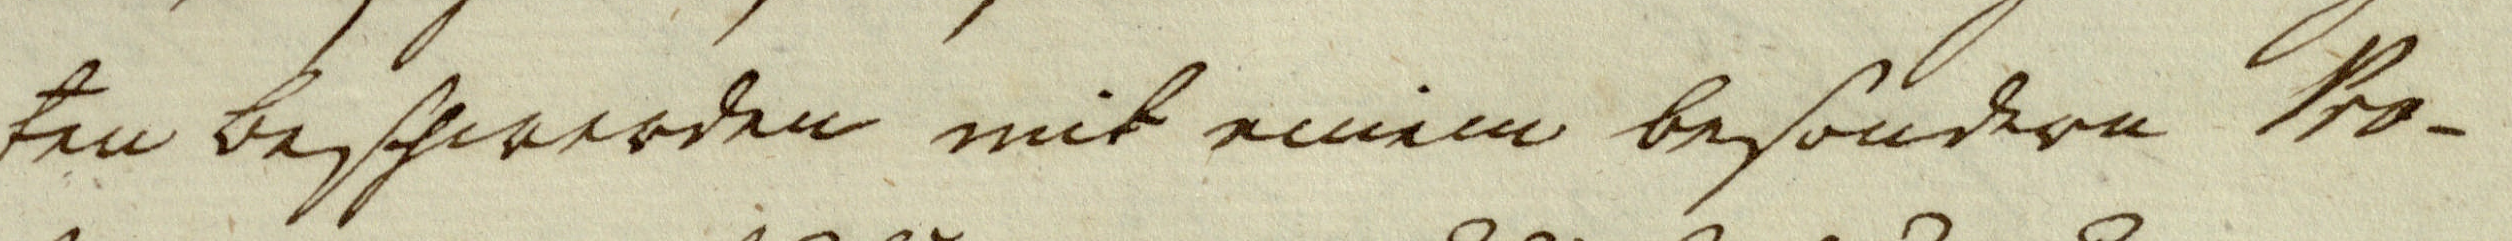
ten Beschwerden mit einem besondern Pro¬
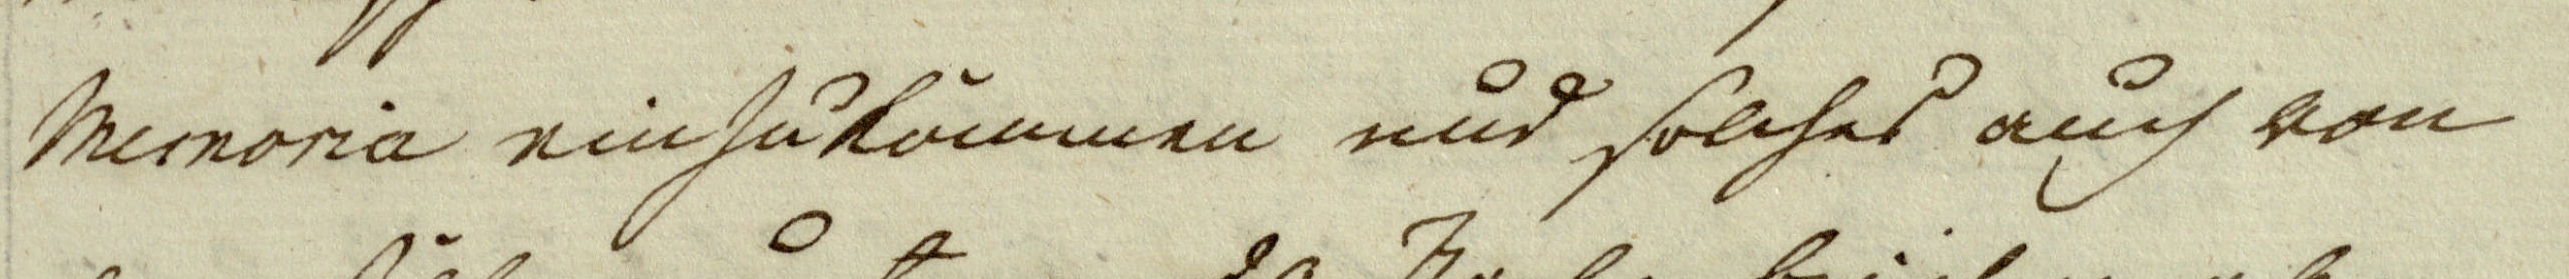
Memora einzukommen und solches auch von
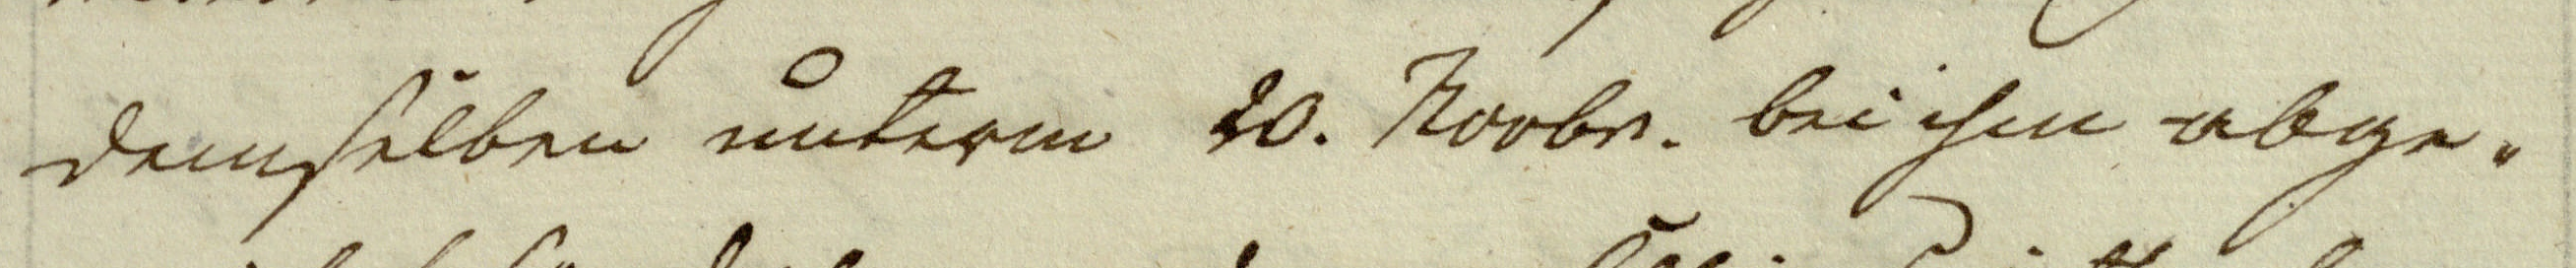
demselben unterm 20. Novbr. bei ihm abge¬
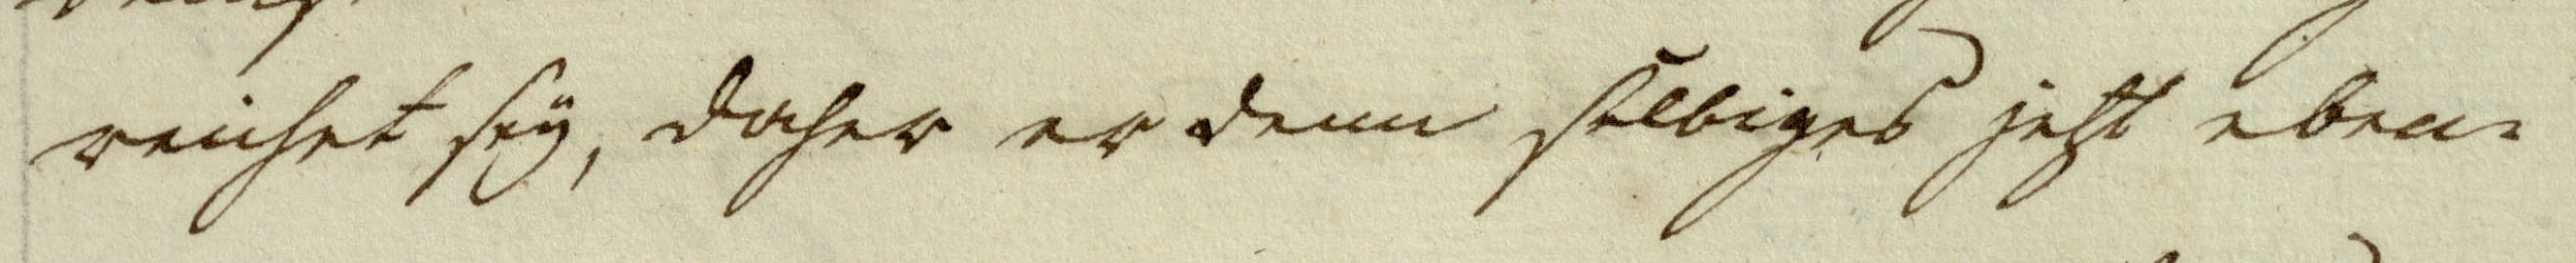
reichet seÿ, daher er denn selbiges jetzt eben¬
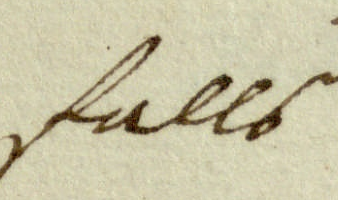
falls
